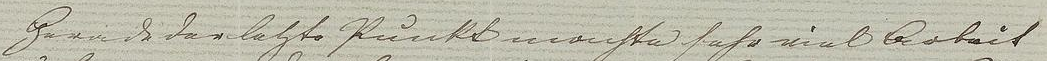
Gerade der letzte Punkt machte sehr viel Arbeit
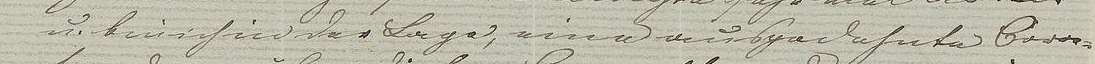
u. bin ich in der Lage, eine ausgedehnte Corre-
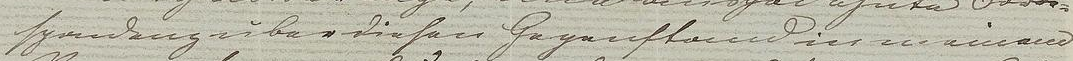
spondenz über diesen Gegenstand in meinem
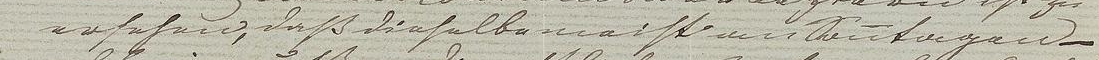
ersehen, daß dieselbe meist an Sonntagen –
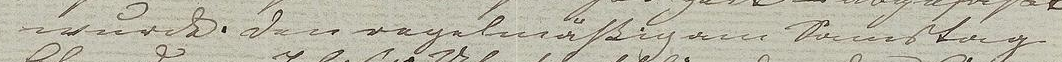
wurde. Den regelmäßig am Samstag
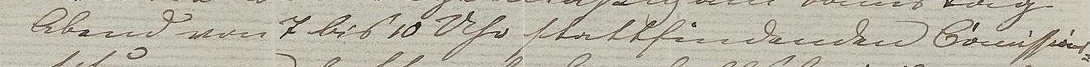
Abend von 7 bis 10 Uhr stattfindenden Comissions-
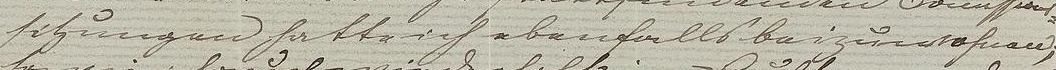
sitzungen hatte ich ebenfalls beizuwohnen;
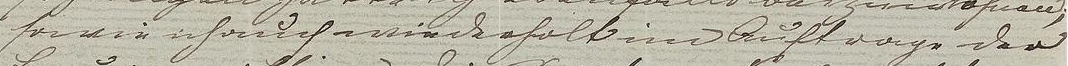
sowie ich auch wiederholt im Auftrage der
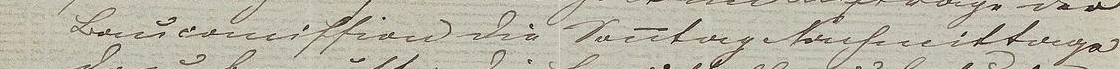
Baucomission die Sonntag Nachmittage
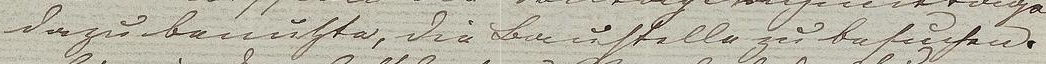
dazu benutzte, die Baustelle zu besuchen.
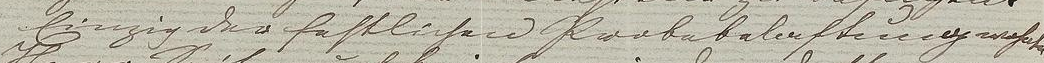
Einzig der festlichen Probebelastung wohnte
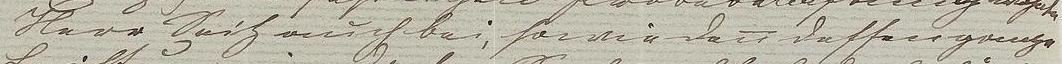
Herr Seitz auch bei, sowie denn dessen ganze
